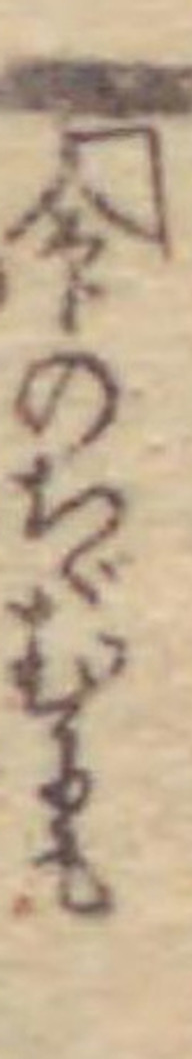〽命のちゞむにも
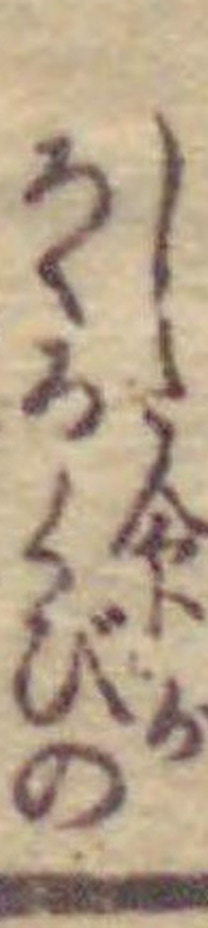ろくろくびの
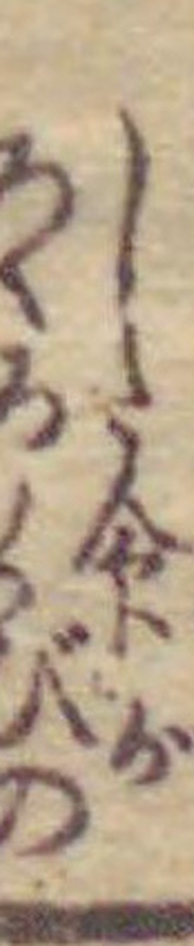ろくろくびの
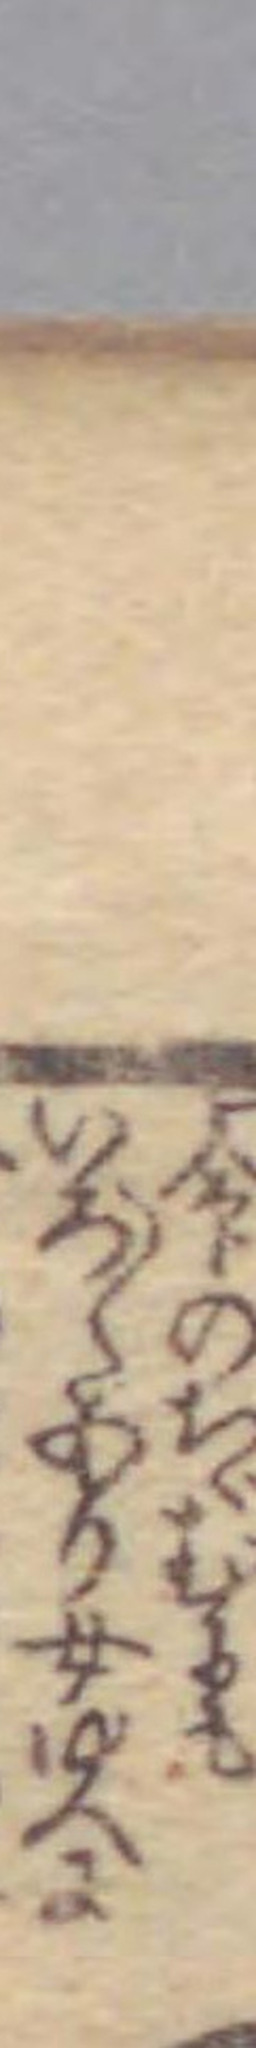いろ〳〵あり女ゆへに
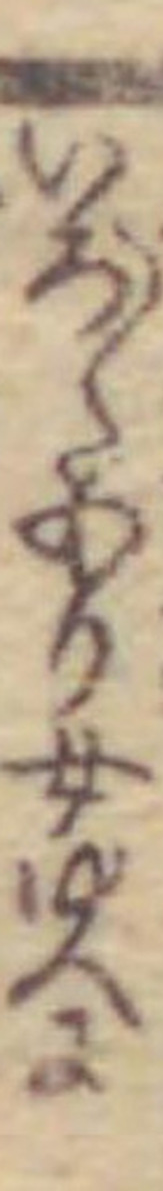いろ〳〵あり女ゆへに
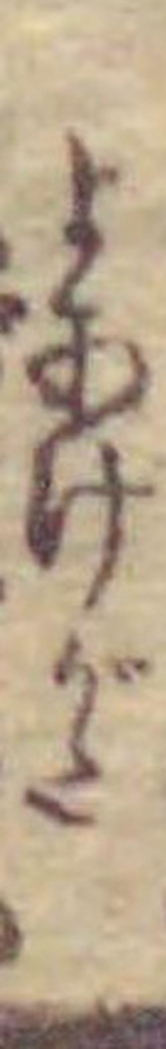よあけがた
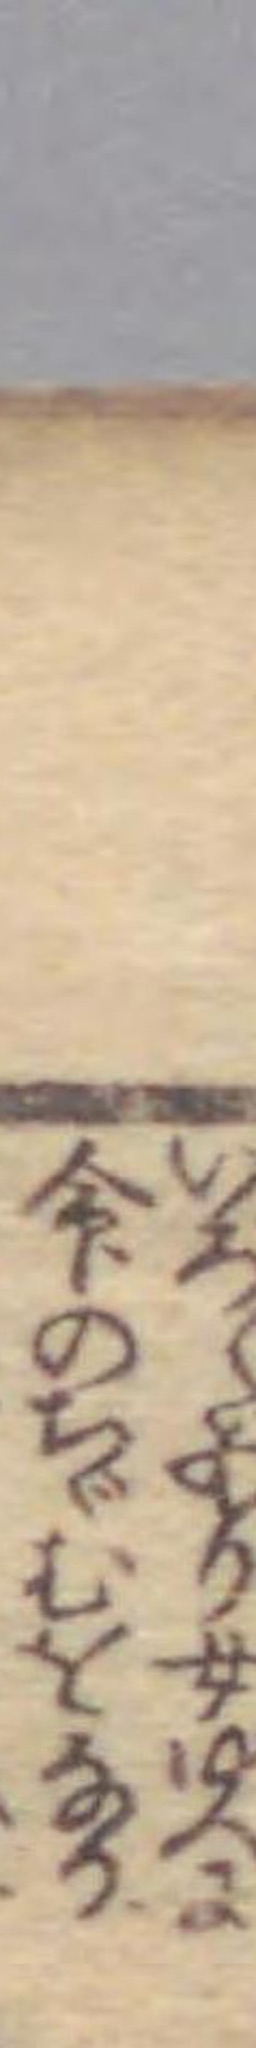命のちゞむをなり
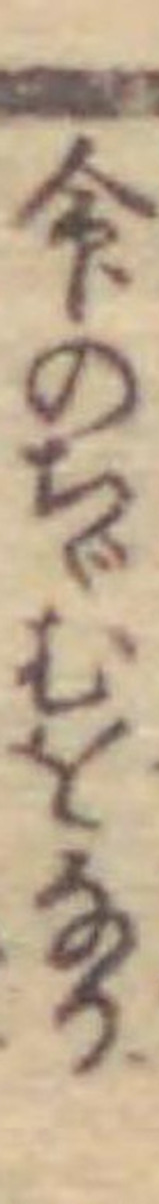命のちゞむをなり
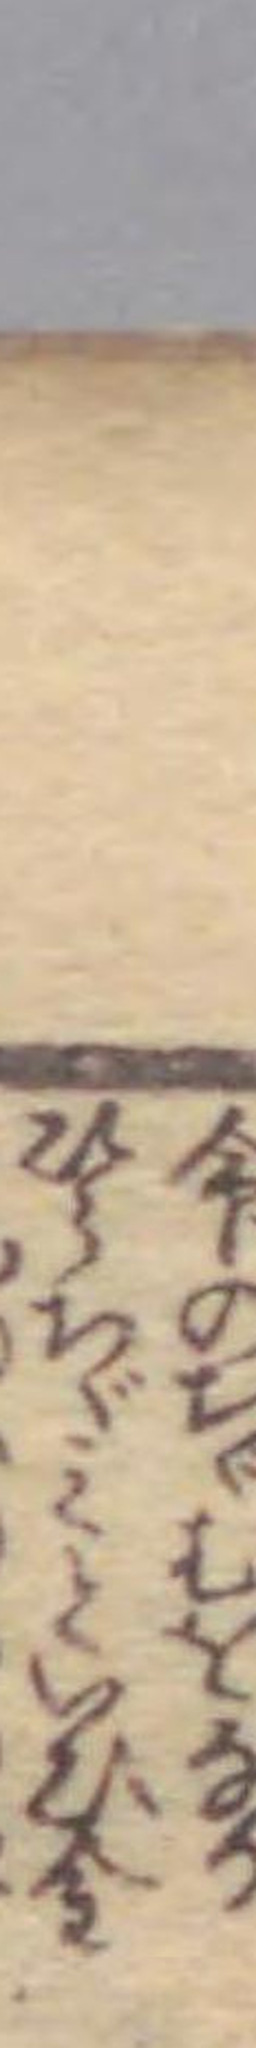ひらちゞみといひ金
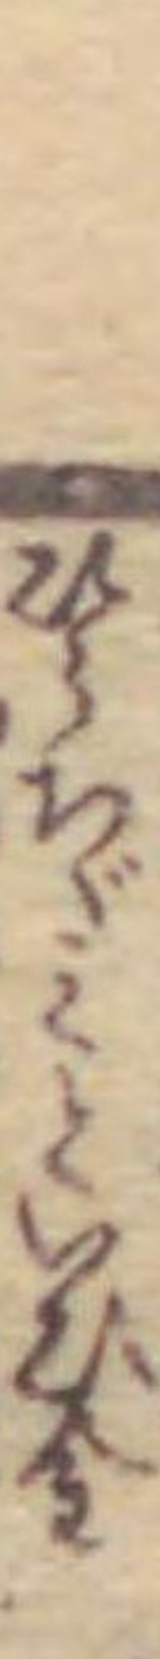ひらちゞみといひ金
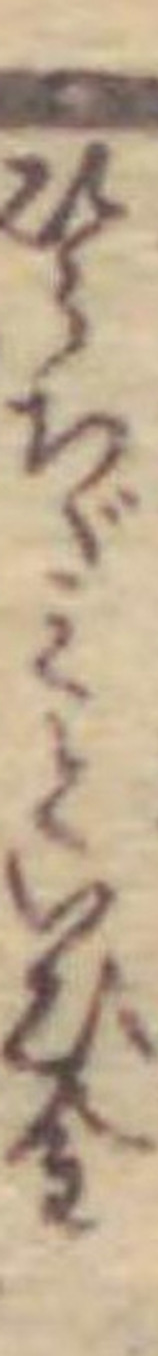ひらちゞみといひ金
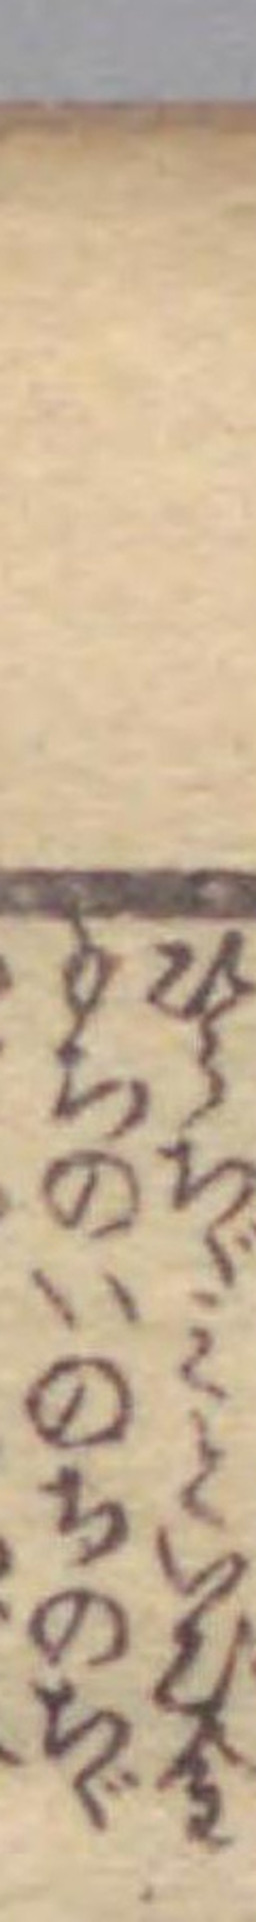もちのいのちのちゞ
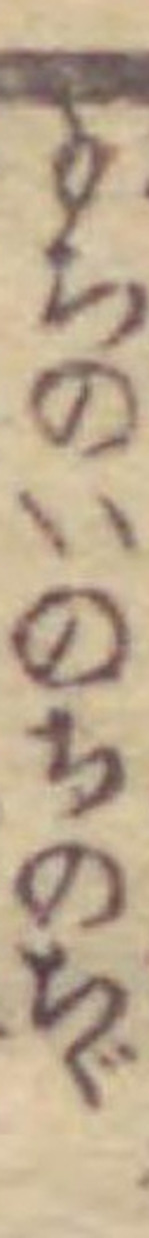もちのいのちのちゞ
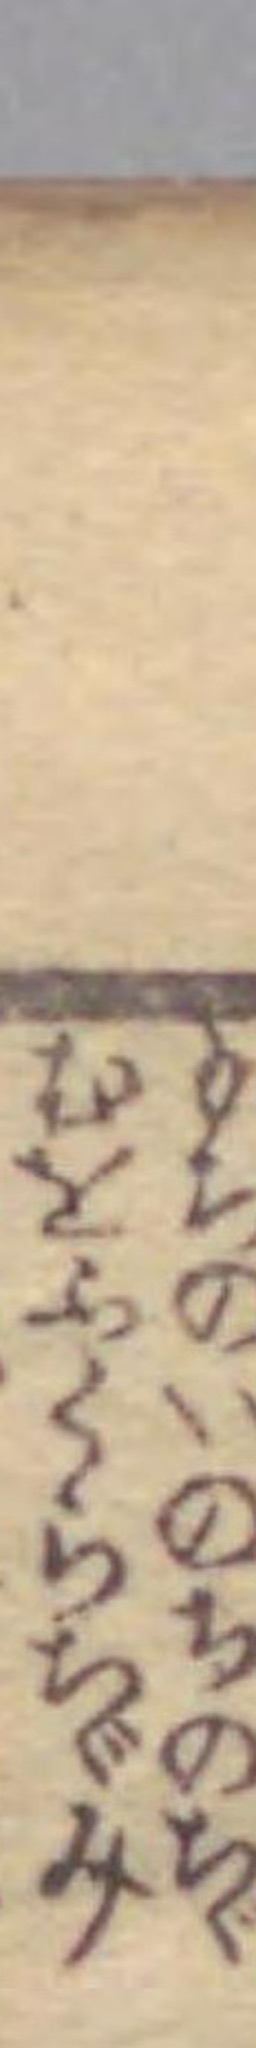むをふくらちゞみ
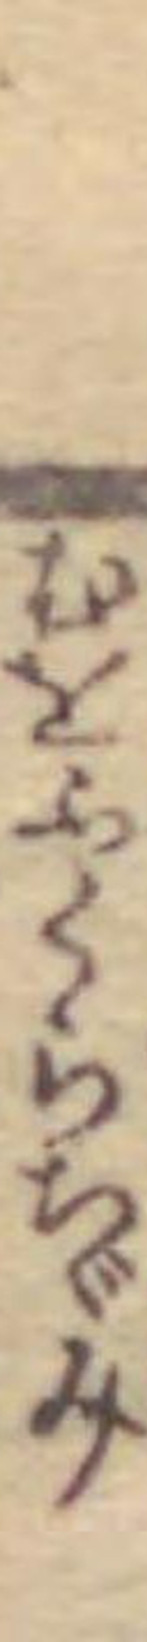むをふくらちゞみ
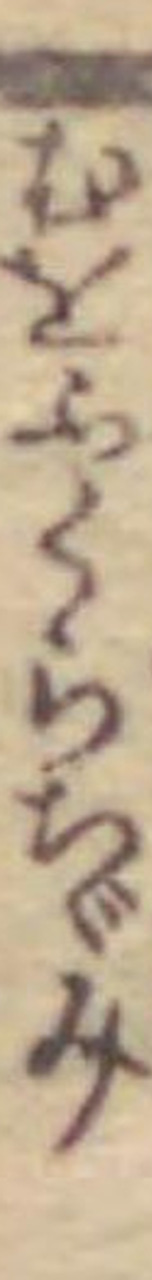むをふくらちゞみ
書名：御誂染長寿小紋 : 3巻
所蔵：国立国会図書館 National Diet Library, JAPAN
